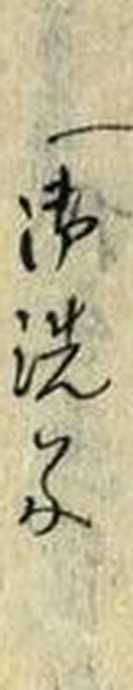御洗米
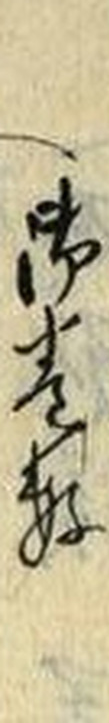御巻数
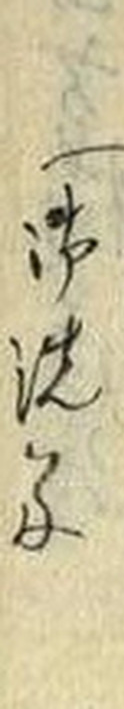御洗米
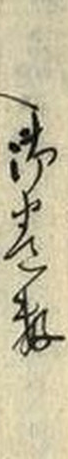御巻数
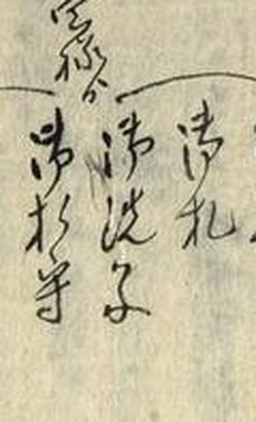御洗米

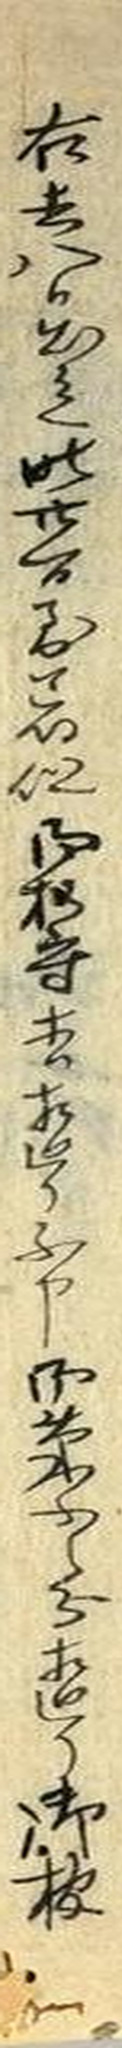右去八日出立昨廿一日到着但御札守等ハ相廻り不申御菓子之分相廻り御棺
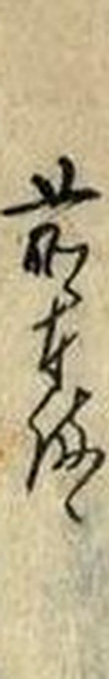前へ奉備候
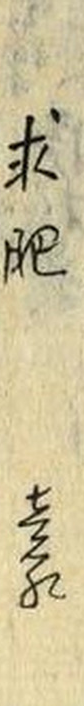求肥壱箱
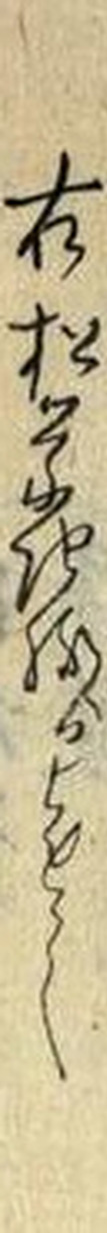右松栄院様ゟ被進之
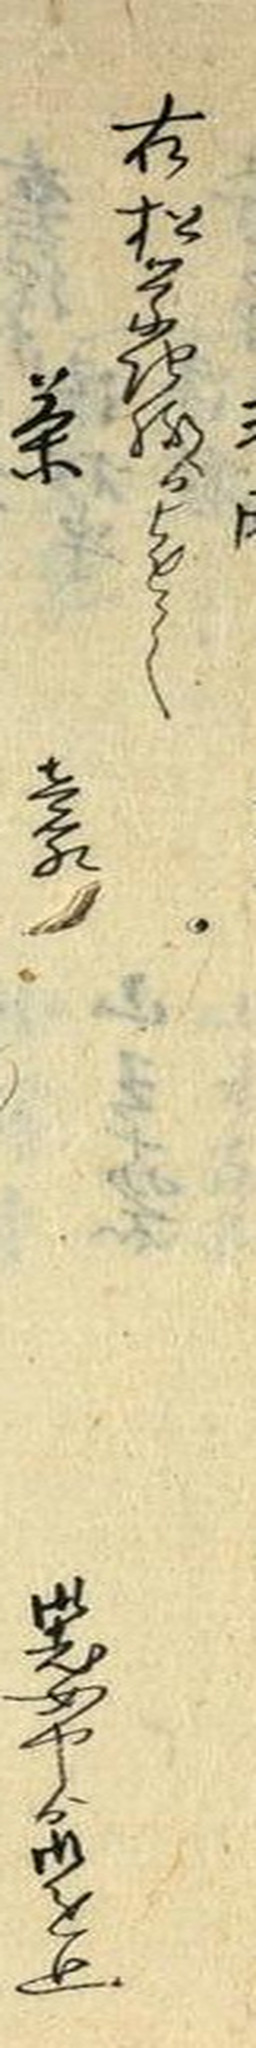茶壱箱御老女中ゟ御進上
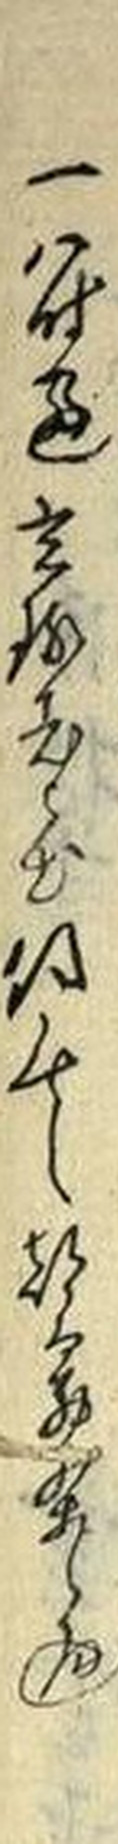一八時過玄琢老被出伺無之都而前条之通
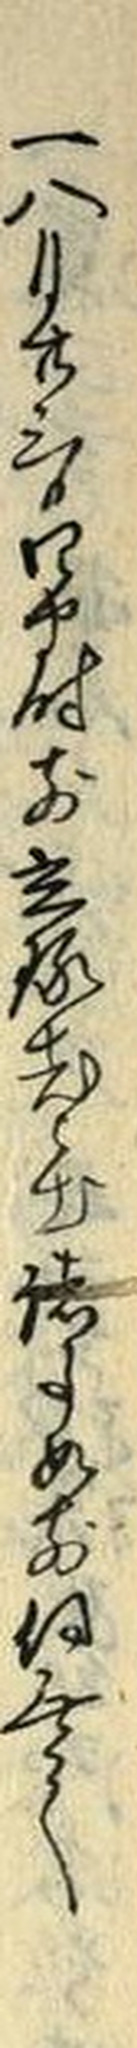一八月廿三日四半時前玄琢老被出諸事如前調無之
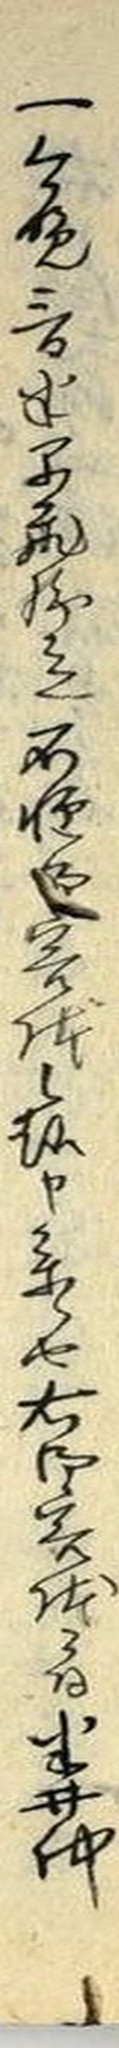一今晩三日半早飛脚立不軽御容体之趣申参候由右御容体ニ付半井仲
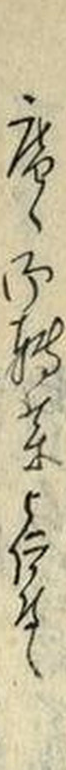庵へ御転薬被仰付候
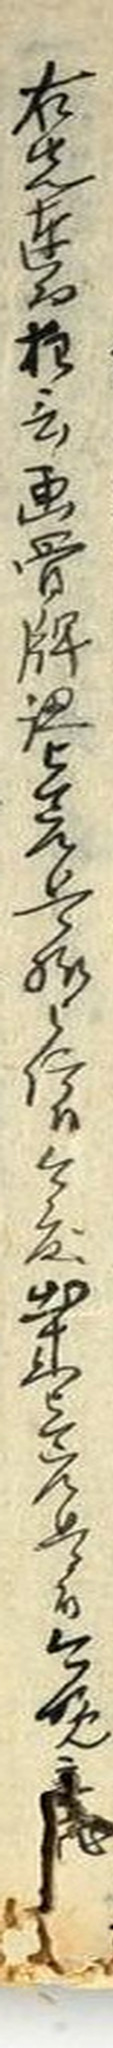右先達而狂言画骨牌認被差上候様被仰付今度出来被差上候ニ付今晩立飛
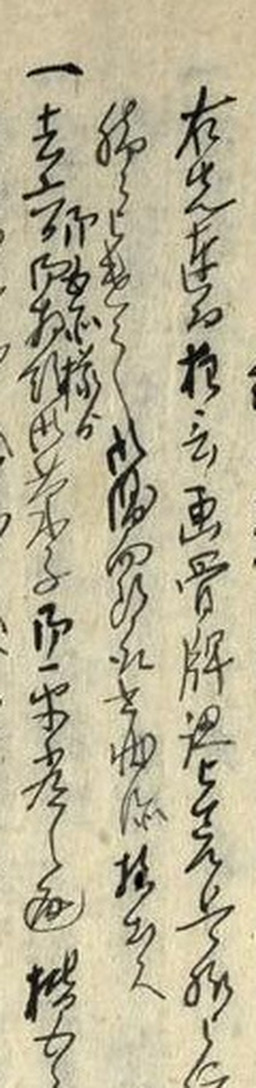脚ニ被遣之御側向頭取書状添指出ス
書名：少傅日録抄（斉善付側向頭取日記、江戸并道中、初入在国、逝去後…
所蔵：福井県文書館 Fukui Prefectural Archives
